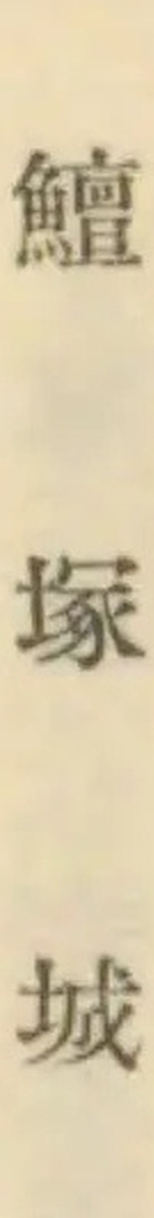鱣塚城
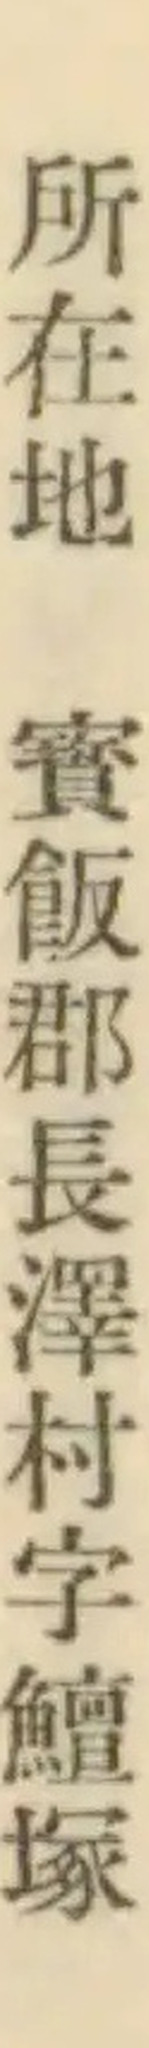所在地宝飯郡長沢村字番場
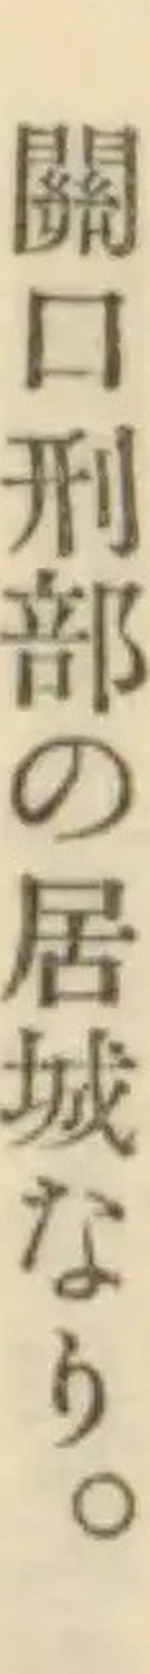関口刑部の居城なり。
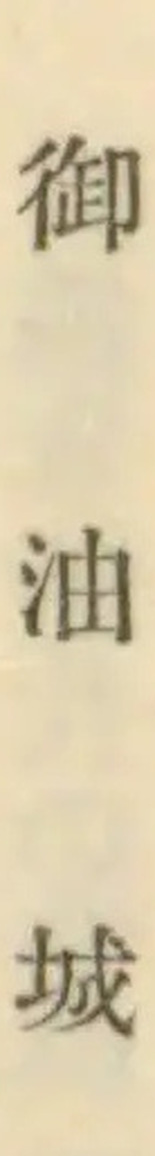御油城
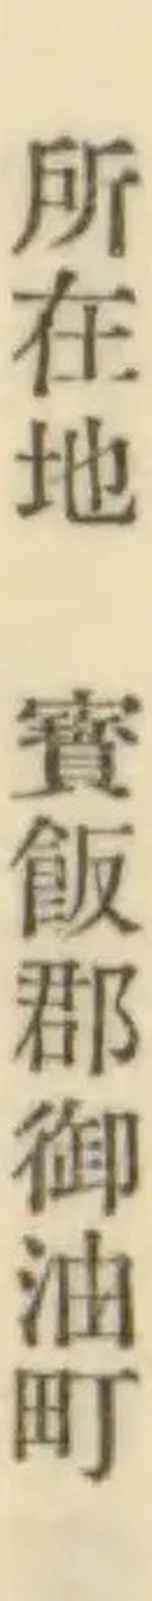所在地宝飯郡御油町
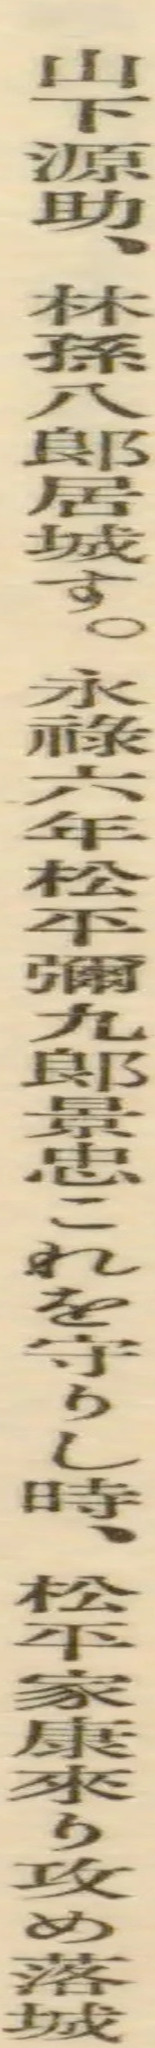山下源助、林孫八郎居城す。永禄六年松平弥九郎影忠これを守りし時、松平家康来り攻め落城
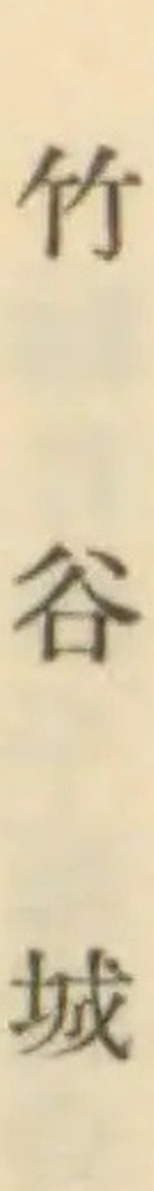竹谷城
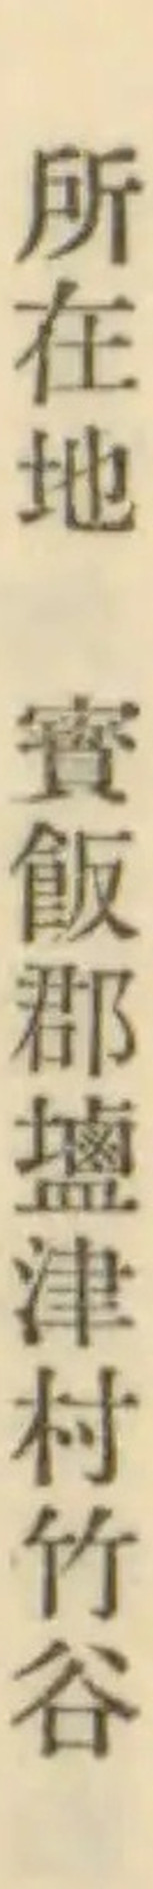所在地宝飯郡塩津村竹谷
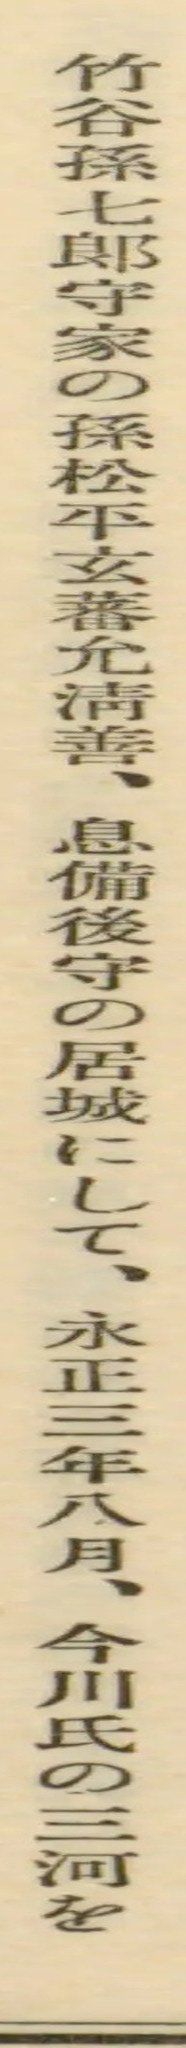竹谷孫七郎守家の孫松平玄蕃允清善、息備後守の居城にして、永正三年八月、今川氏の三河を

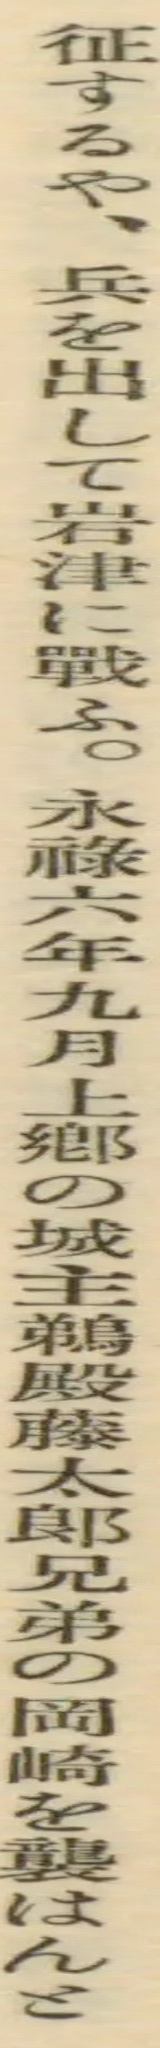征するや、兵を出して岩津に戦ふ。永禄六年九月上郷の城主鵜殿藤太郎兄弟の岡崎を襲はんと
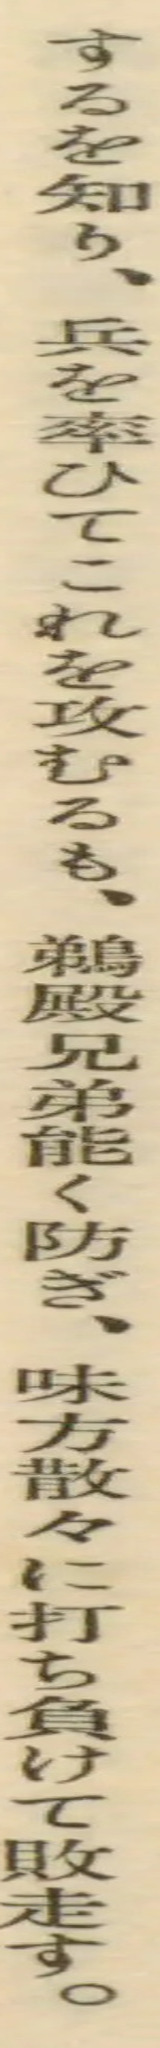するを知り、兵を率ひてこれを攻むるも、鵜殿兄弟能く防ぎ、味方散々に打ち負けて敗走す。
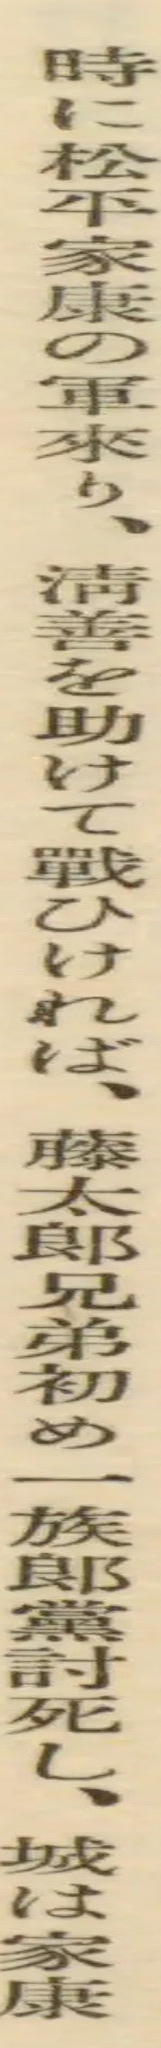時に松平家康の軍来り、清善を助けて戦ひければ、藤太郎兄弟初め一族郎党討死し、城は家康
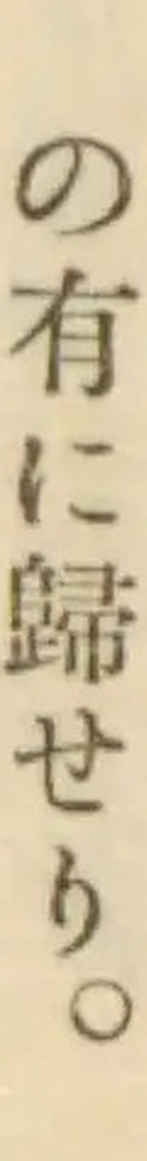の有に帰せり。
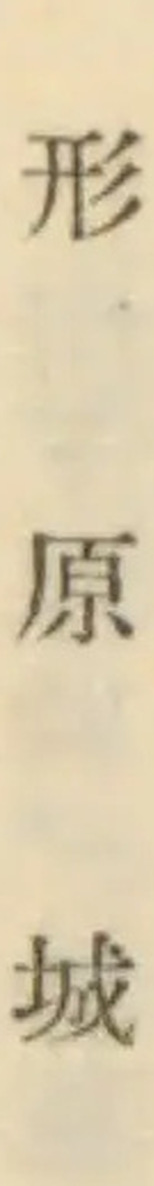形原城
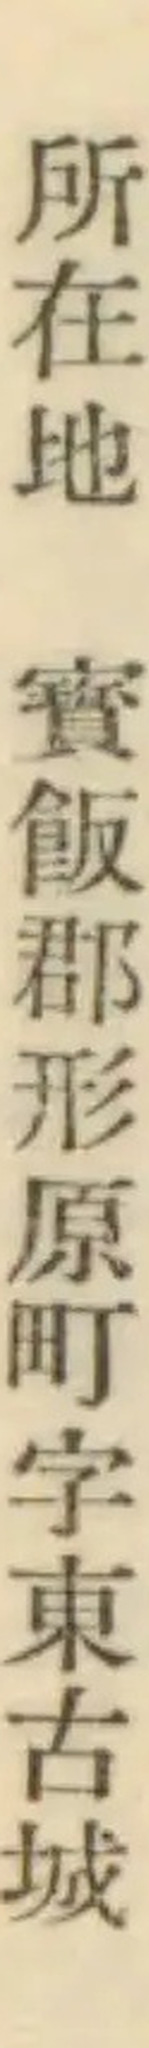所在地宝飯郡形原町字東古城
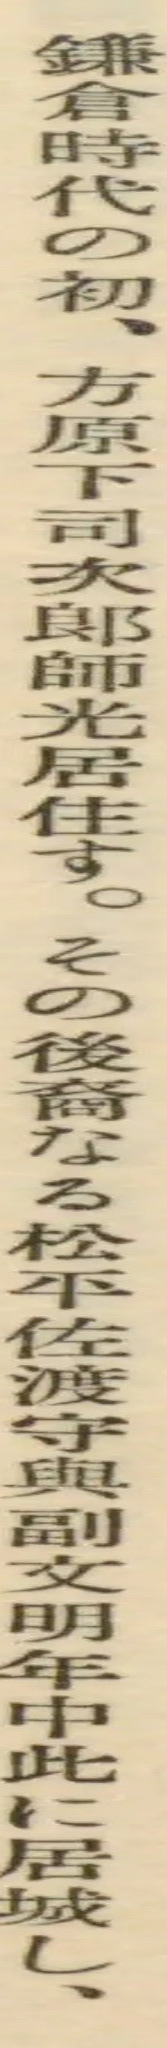鎌倉時代の初、方原下司次郎師光居住す。その後裔なる松平佐渡守與副文明年中此に居城し、
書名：東三河之古城
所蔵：国立国会図書館 National Diet Library, JAPAN
